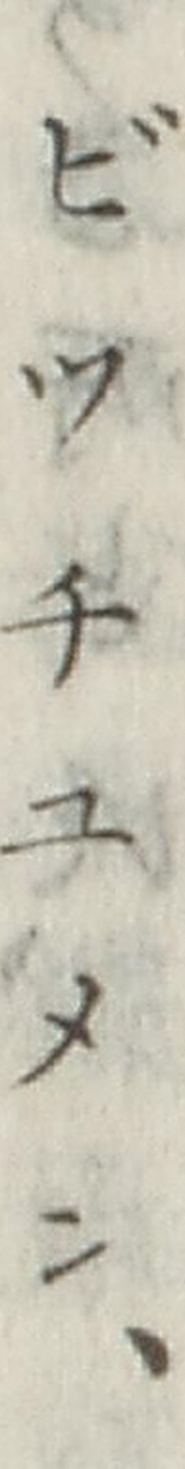ビツチユメン、
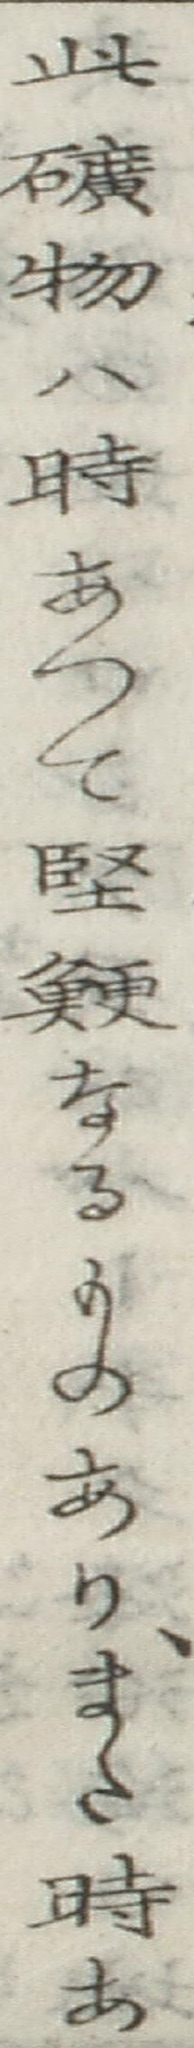此砿物は時あつて堅硬なるものあり、また時あ
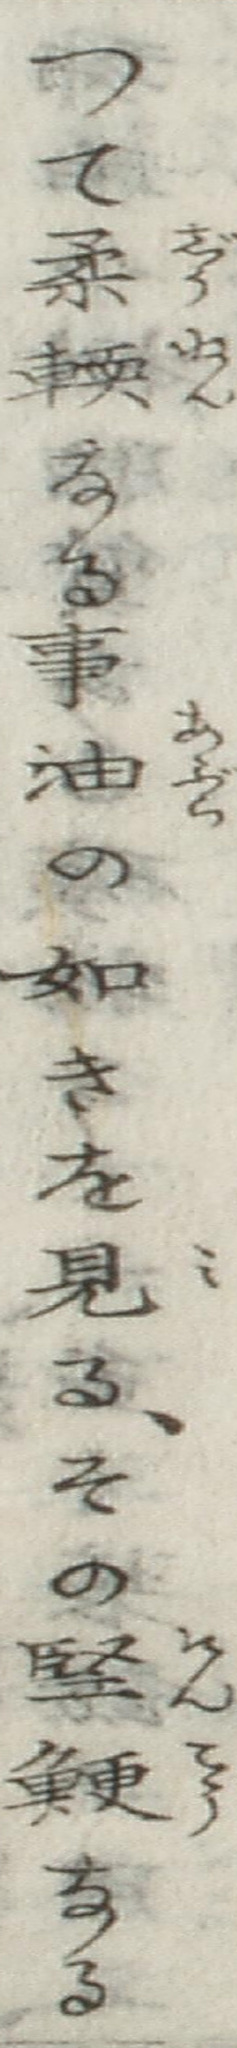つて柔軟なる事油の如きを見る、その堅硬なる
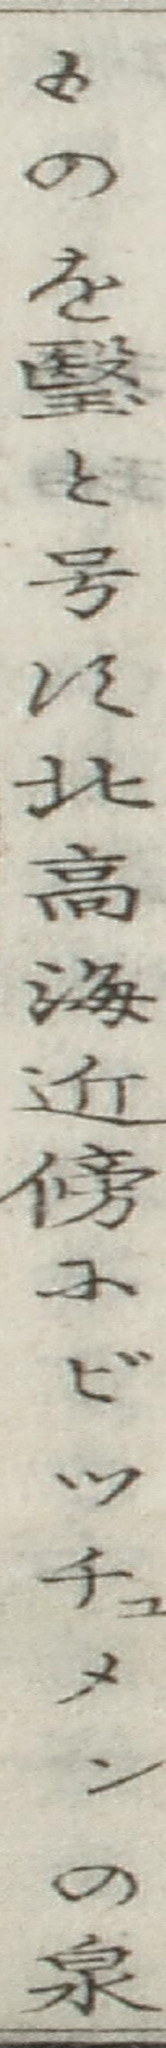ものを瑿と号す、北高海近傍にビツチュメンの泉
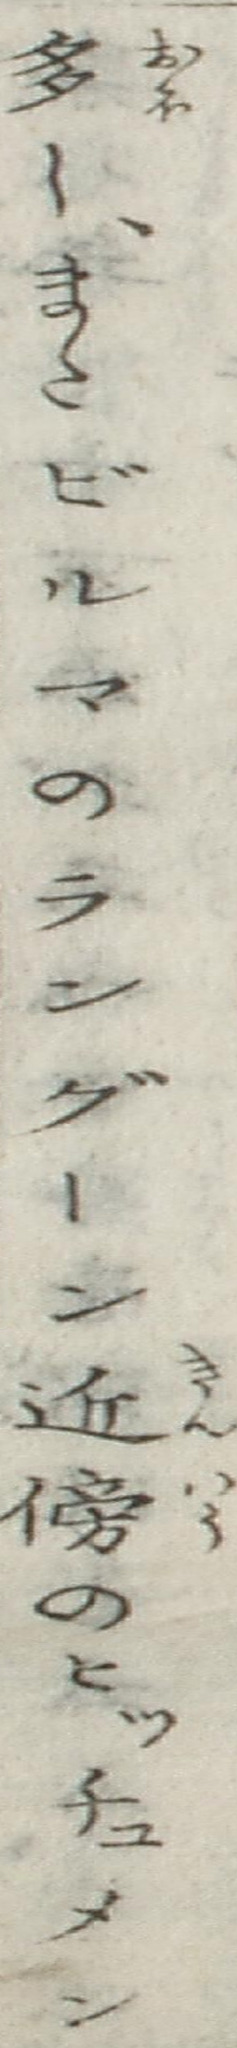多し、またビルマのラングーン近傍のヒッチュメン

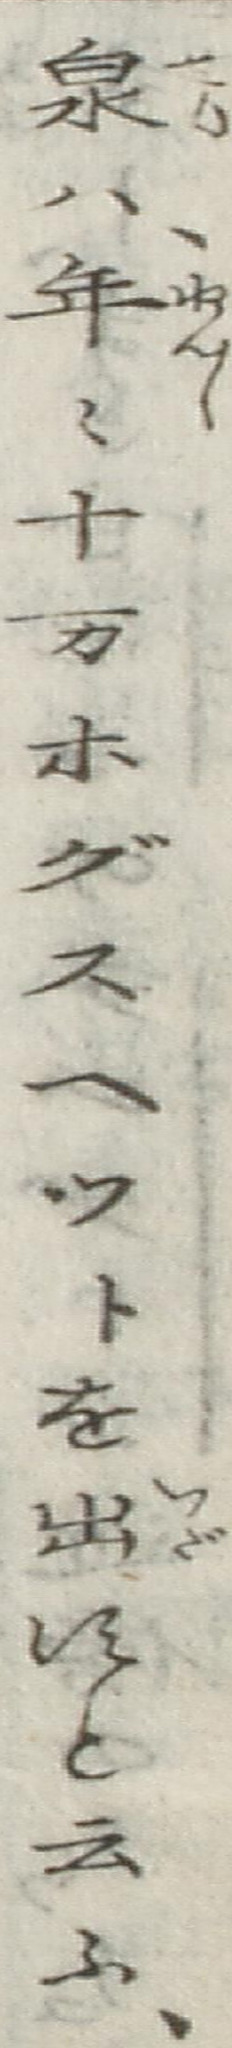泉は、年〻十万ホグスヘツトを出すと云ふ、
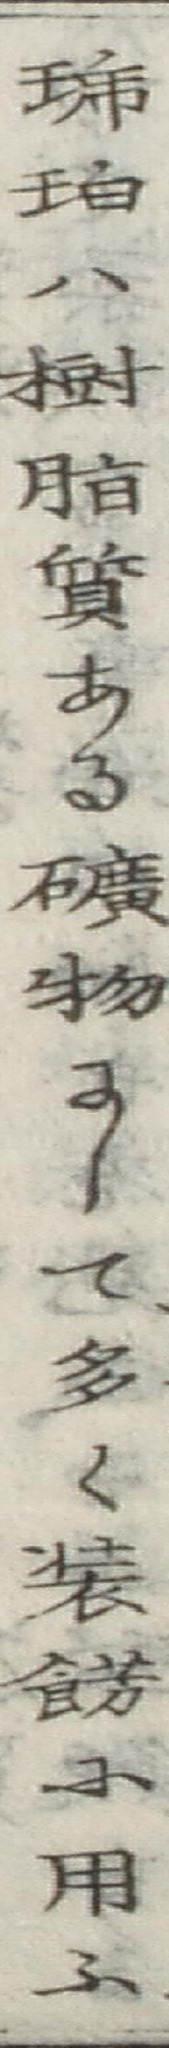琥珀は樹脂質ある砿物にして、多く装飾に用ふ、
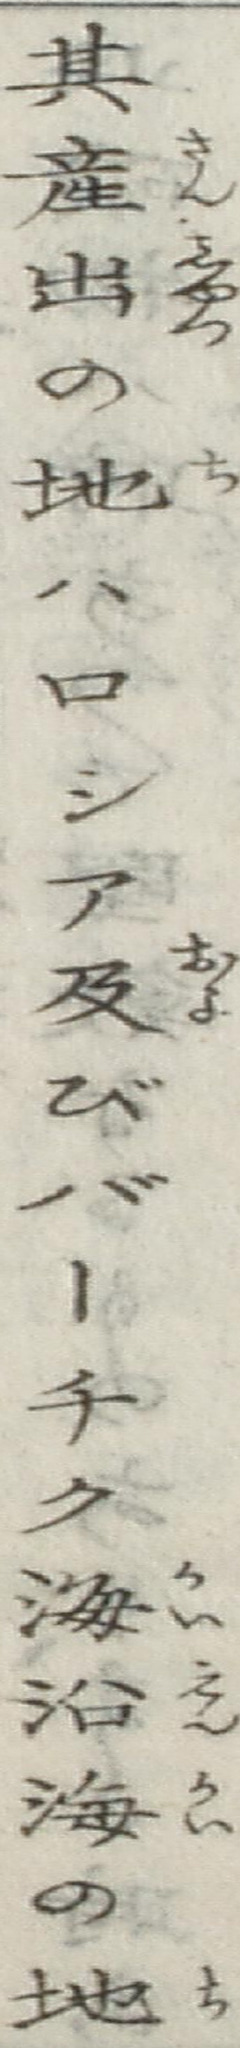其産出の地はロシア及びバーチク海沿海の地
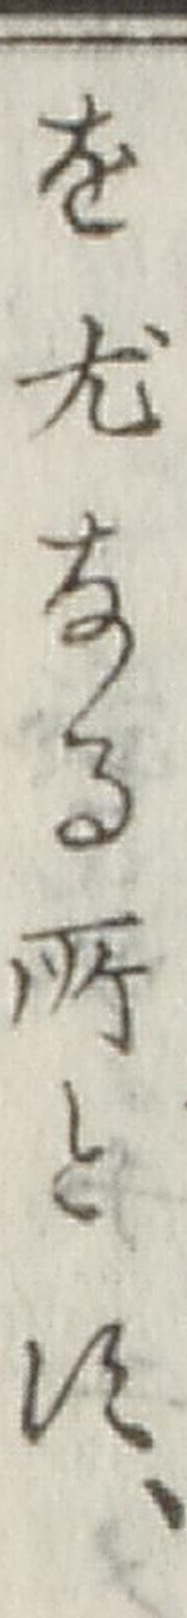を尤なる所とす、
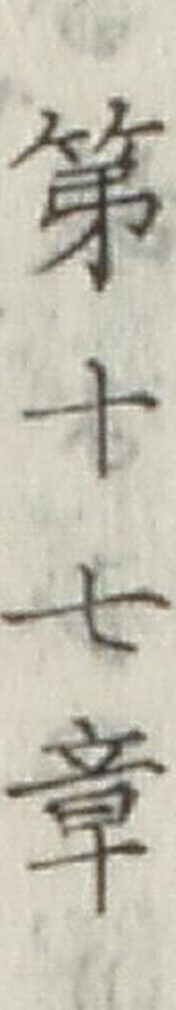第十七章
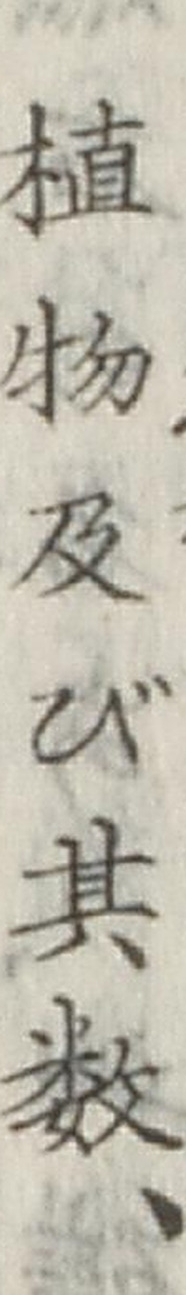植物及び其数、
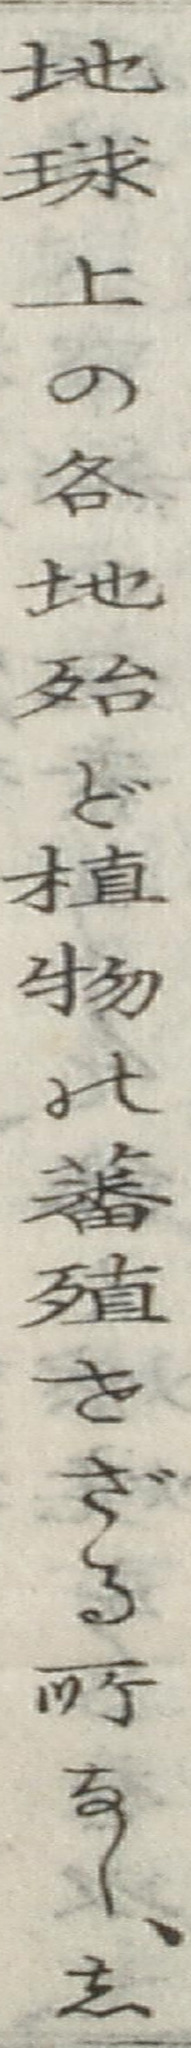地球上の各地殆ど植物の蕃殖せざる所なし、し
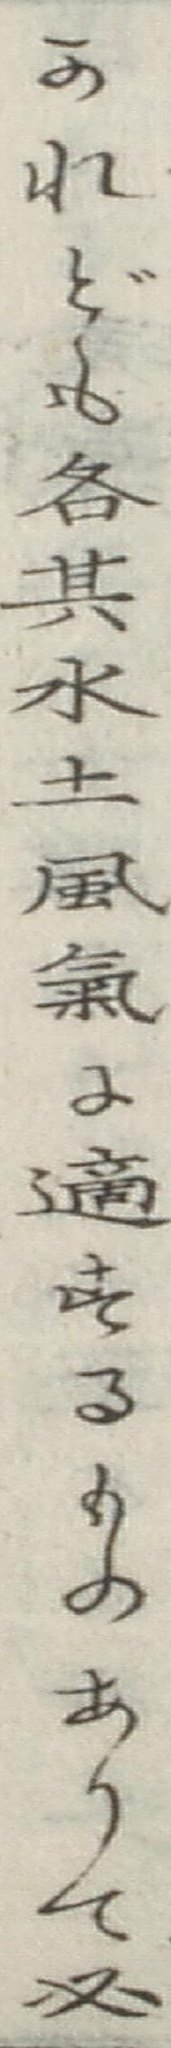かれども各其水土風気に適するものありて、必
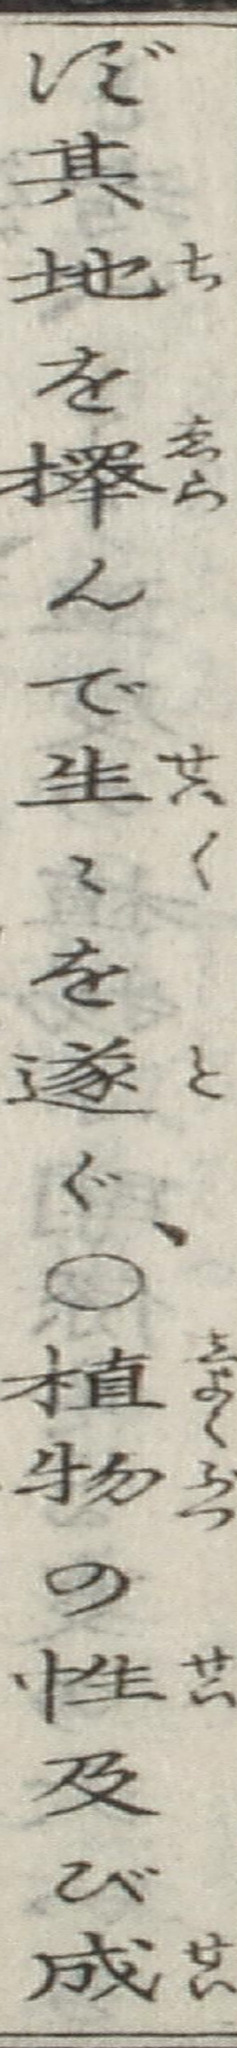ず其地を択んで生〻を遂ぐ、○植物の性及び成
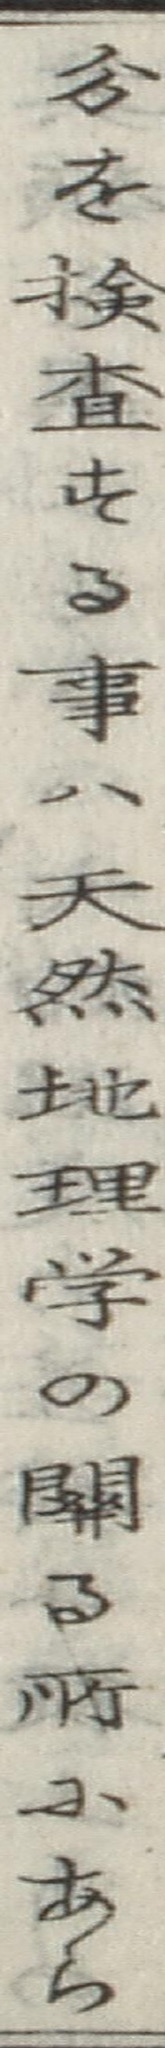分を検査する事は、天然地理学の関る所にあら
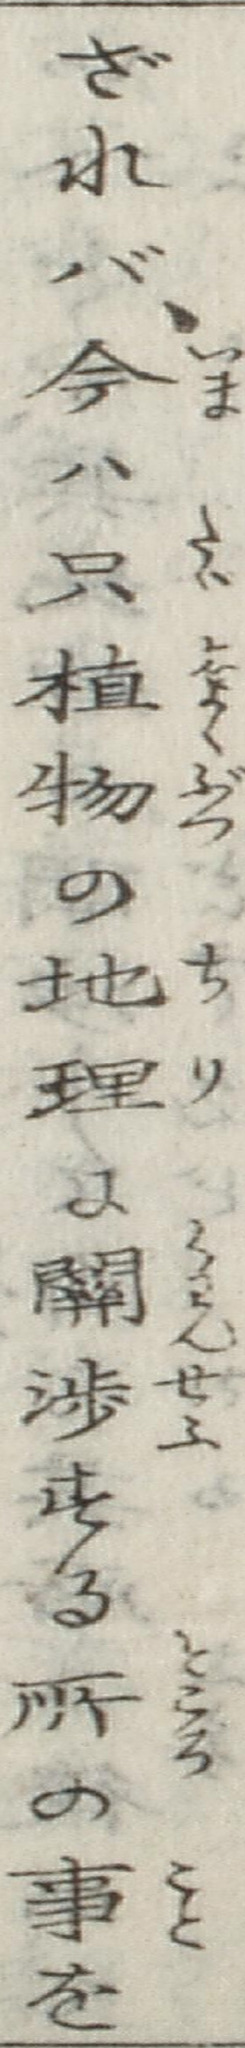ざれば、今は只植物の地理に関渉する所の事を
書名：訓蒙　天然地理學　下
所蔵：東京大学地震研究所図書室 Earthquake Research Institute Library, The University of Tokyo, JAPAN
